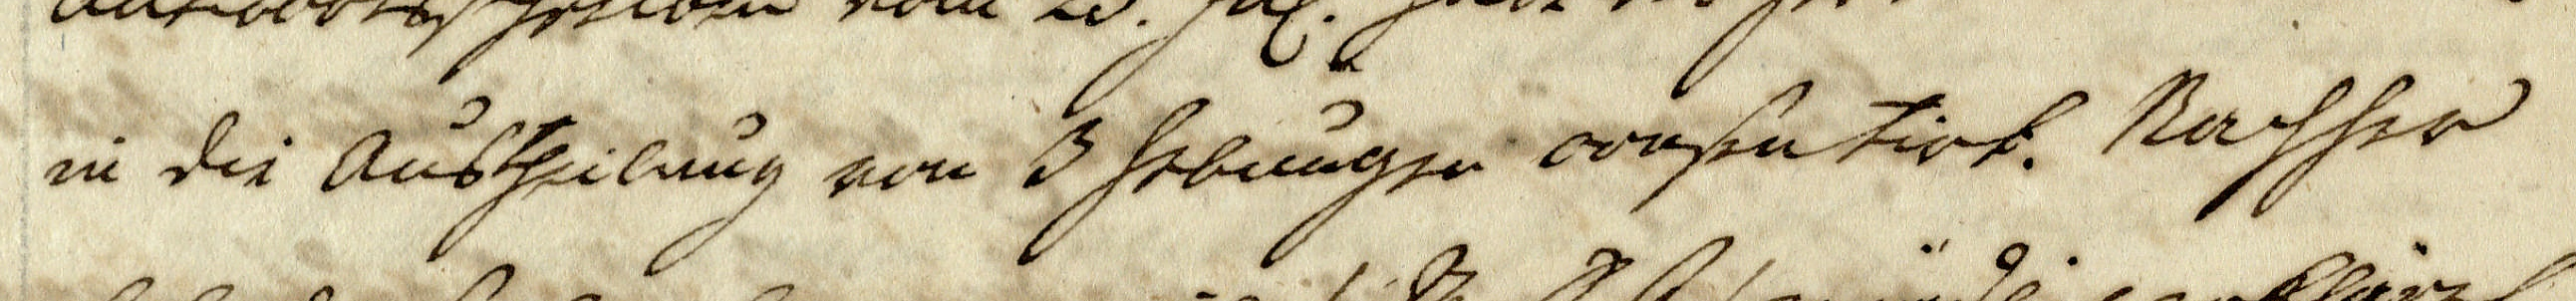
in die Austhilung von 3 Hebungen consentirt. Nachher
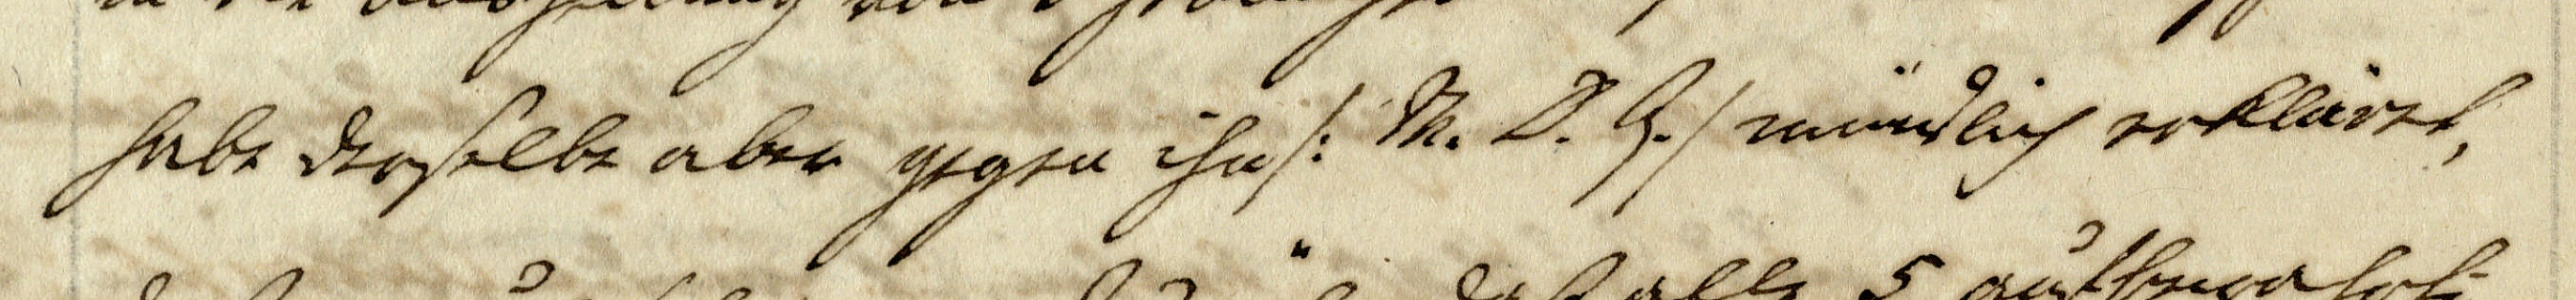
habe derselbe aber gegen ihn /: M. D. R./ mündlich erkläret,
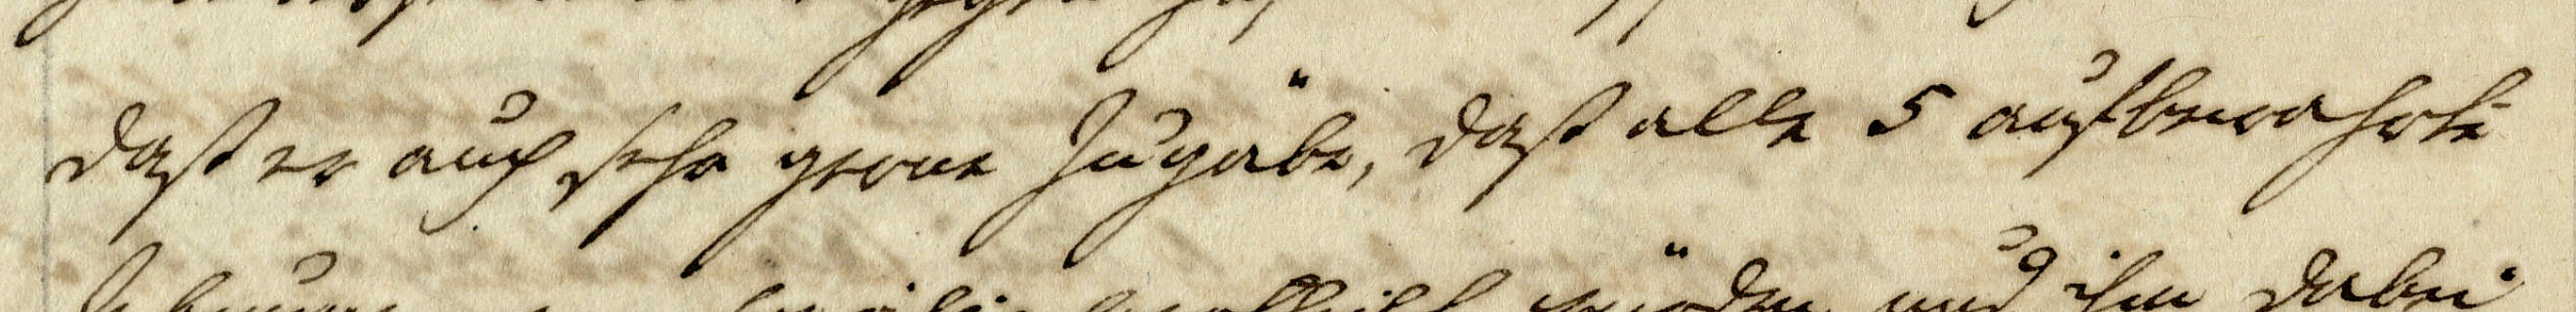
daß er auch sehr gerne zugäbe, daß alle 5 aufbewahrte
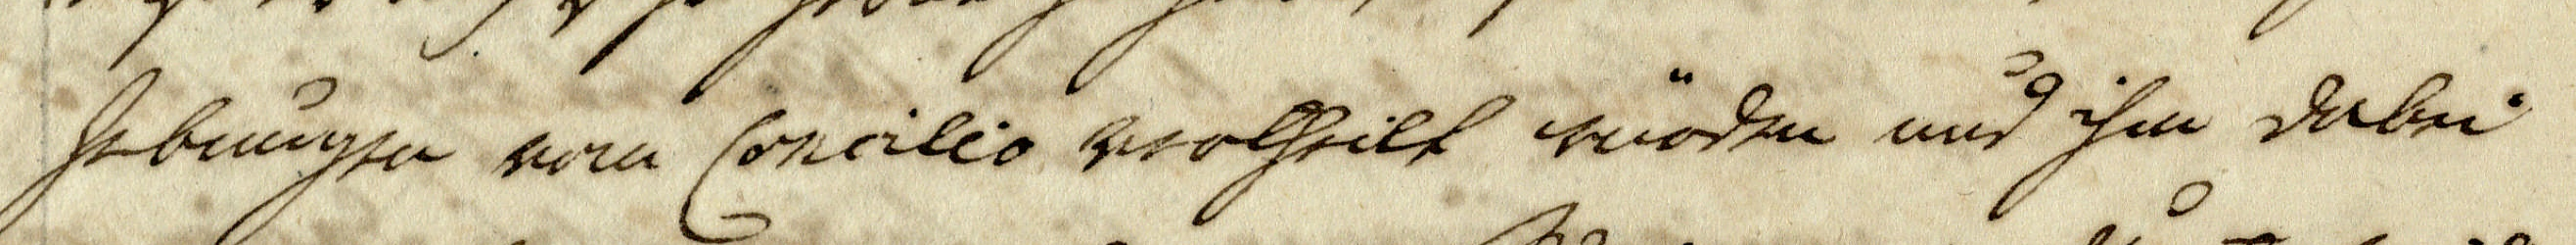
Hebungen vom Concilio vertheilt würden und ihm dabei
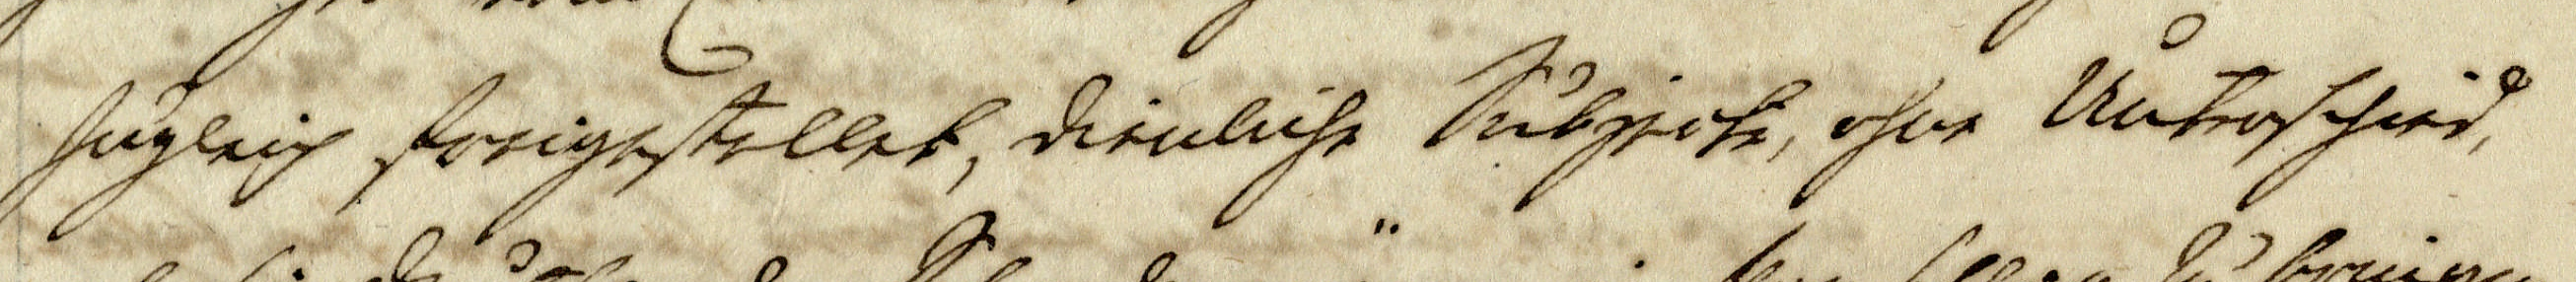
zugleich freigestellet, dienliche Subjecte, ohne Unterschied,
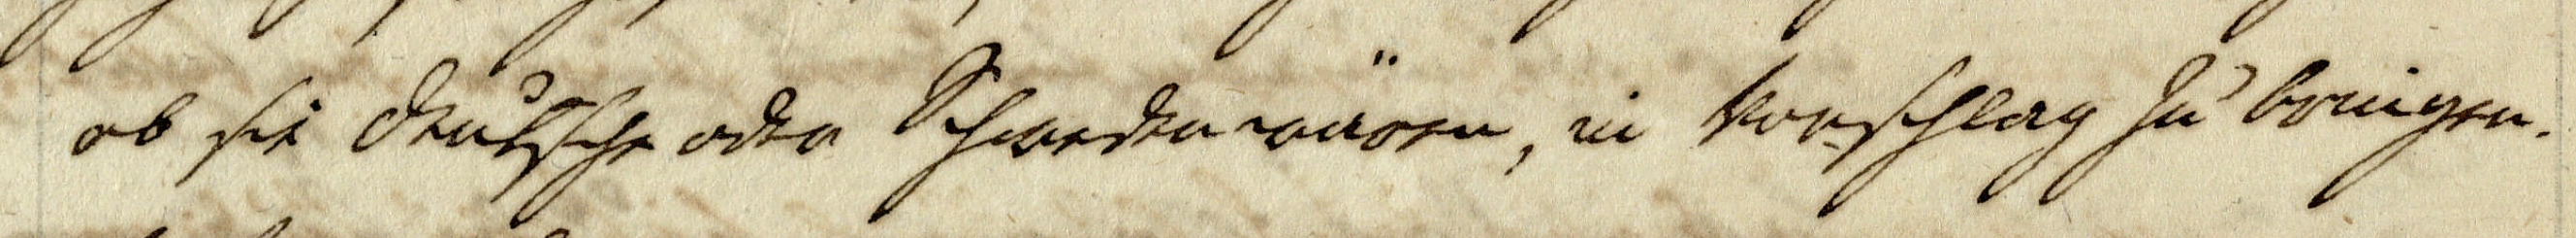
ob sie Deutsche oder Schweden wären, in Vorschlag zu bringen.
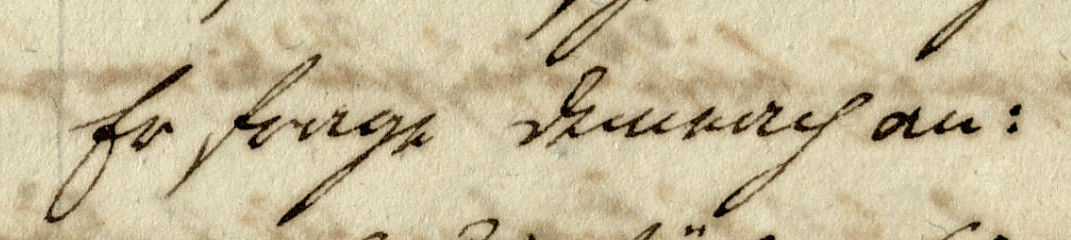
Er frage demnach an:
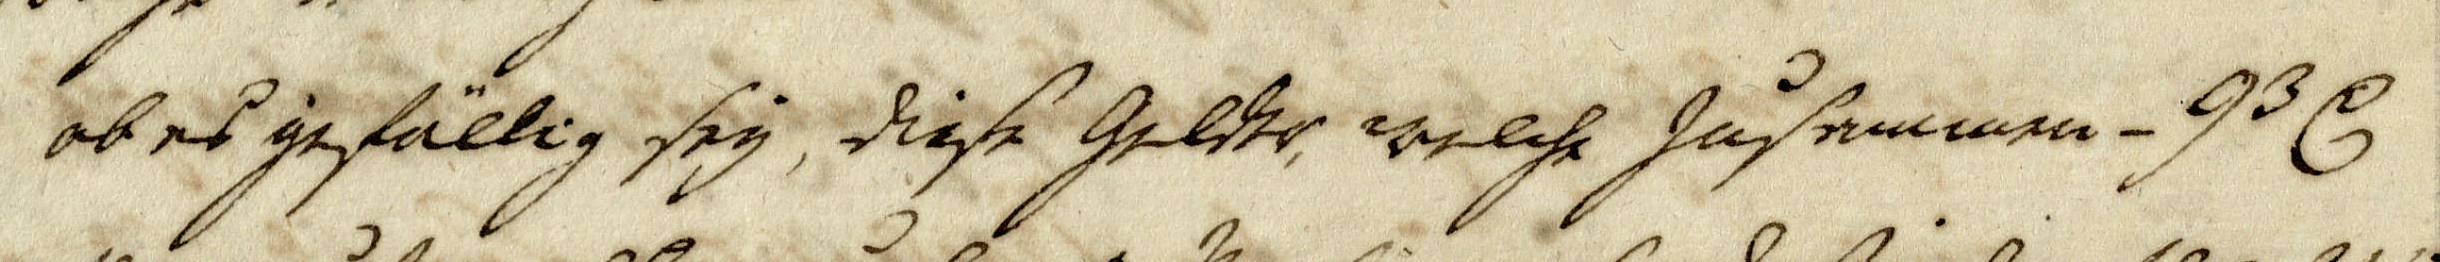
ob es gefällig seÿ, diese Gelder welche zusammen 93 l
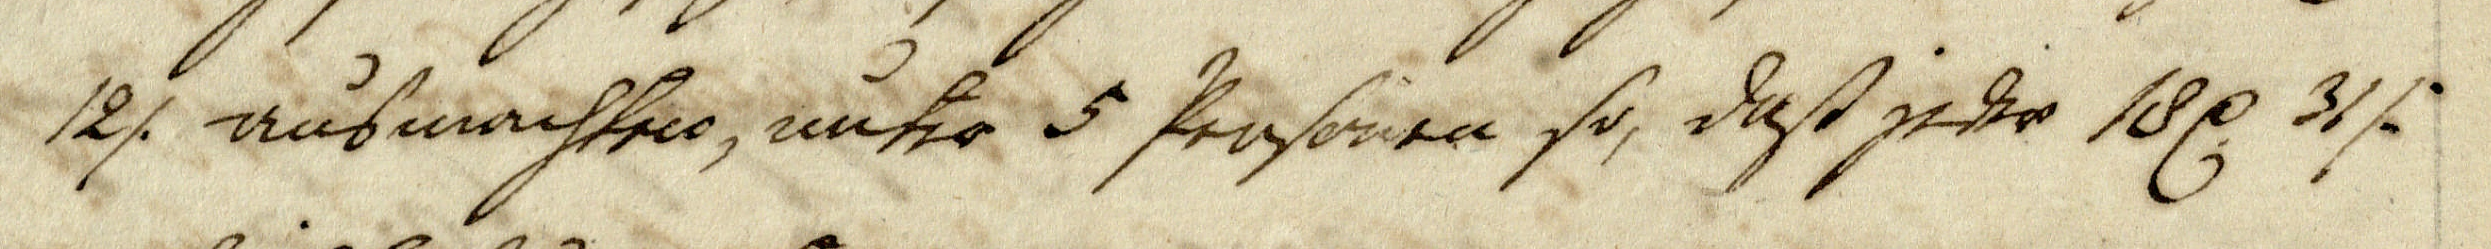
12 s. ausmachten, unter 5 Personen so, daß jeder 18 l. 31s.
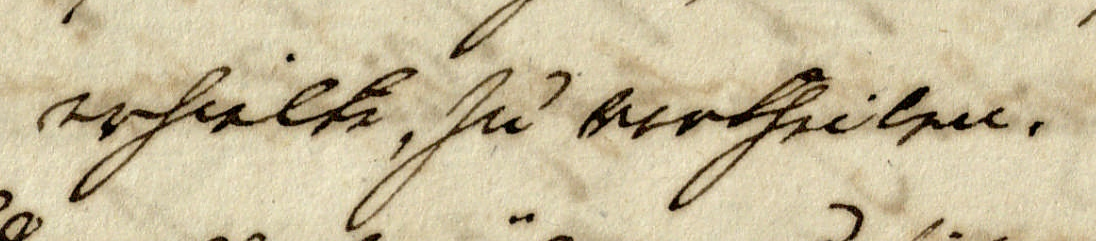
erhielte, zu vertheilen.
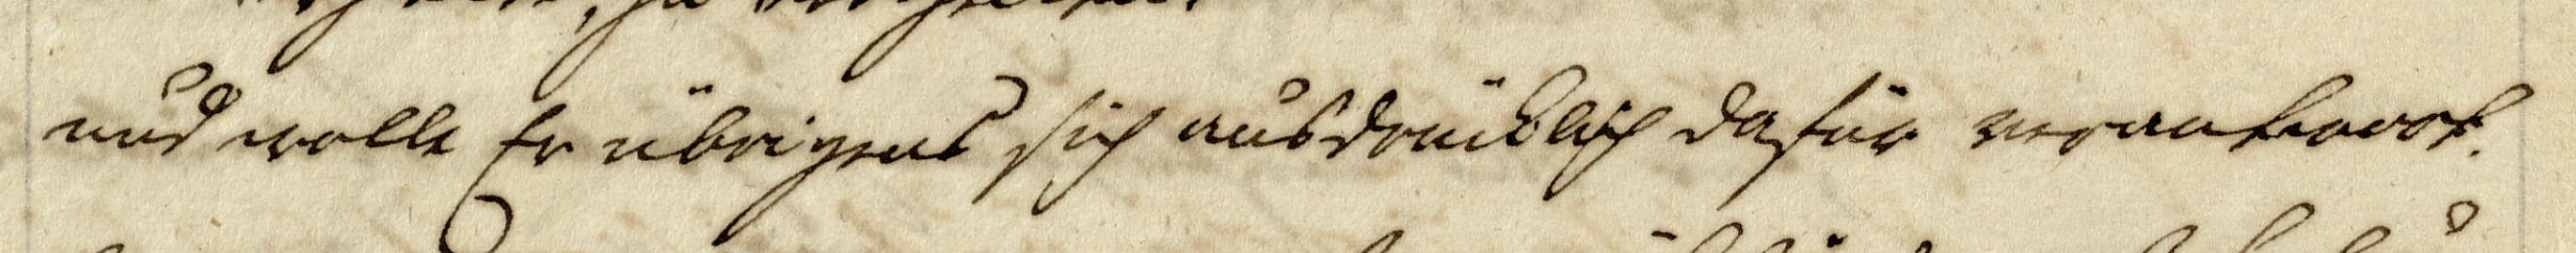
und wolle Er übrigens sich ausdrücklich dafür verantwort¬
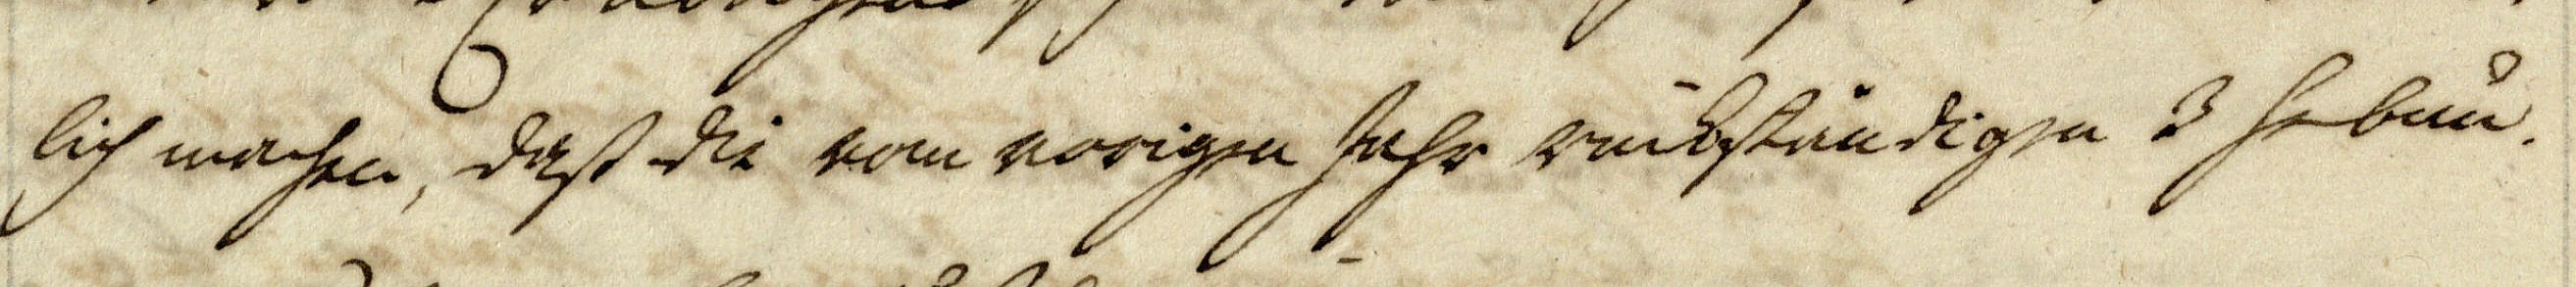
lich machen, daß die vom vorigen Jahr rückständigen 3 Hebun¬
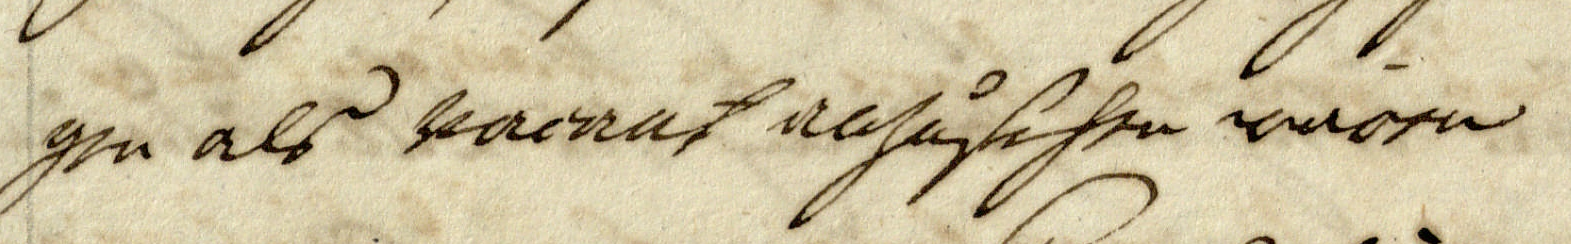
gen als vacant anzusehen wären.
